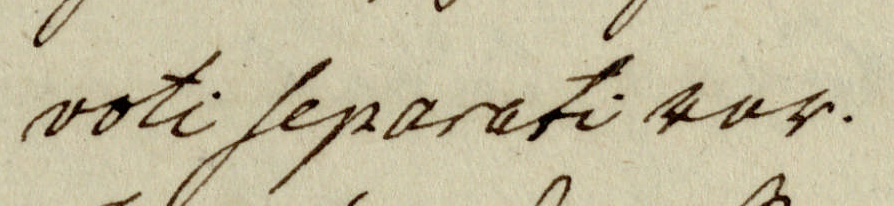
voti separati vor.
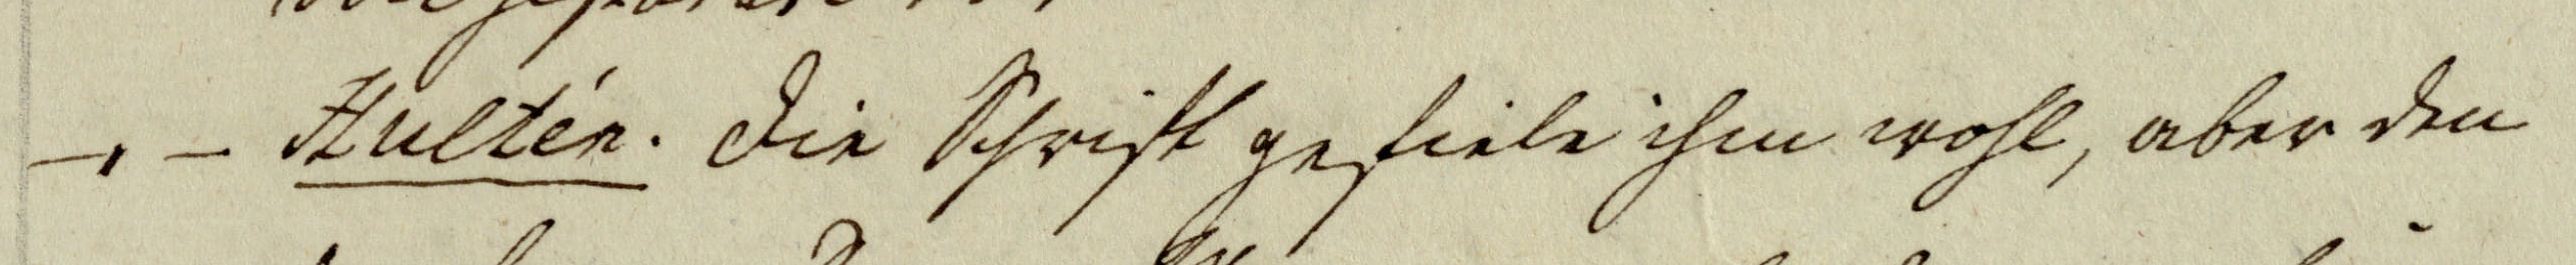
Hultén. Die Schrift gefiele ihm wohl, aber den
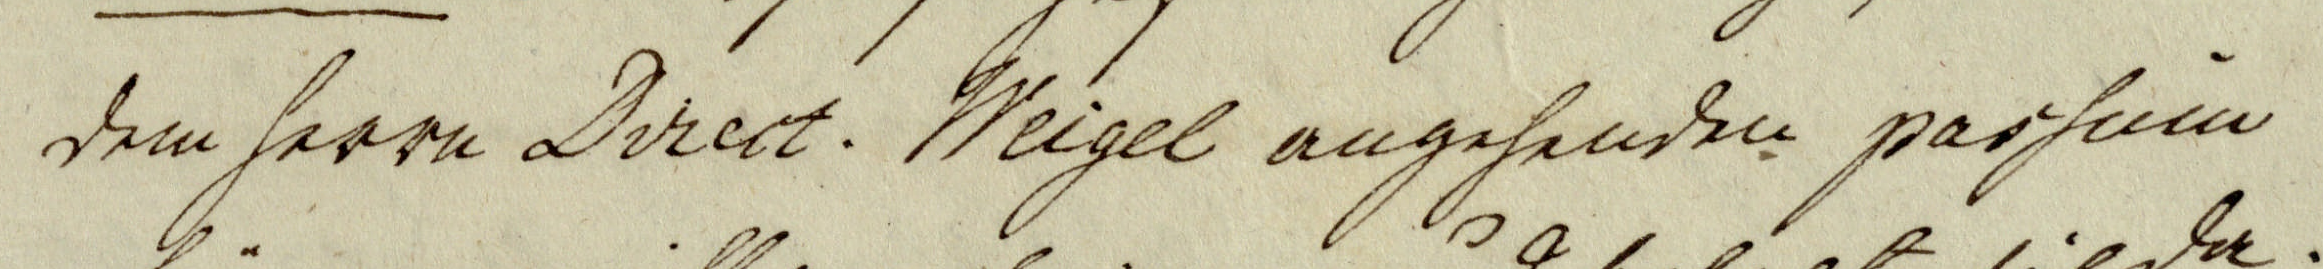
dem Herrn Direct. Weigel angehende passum
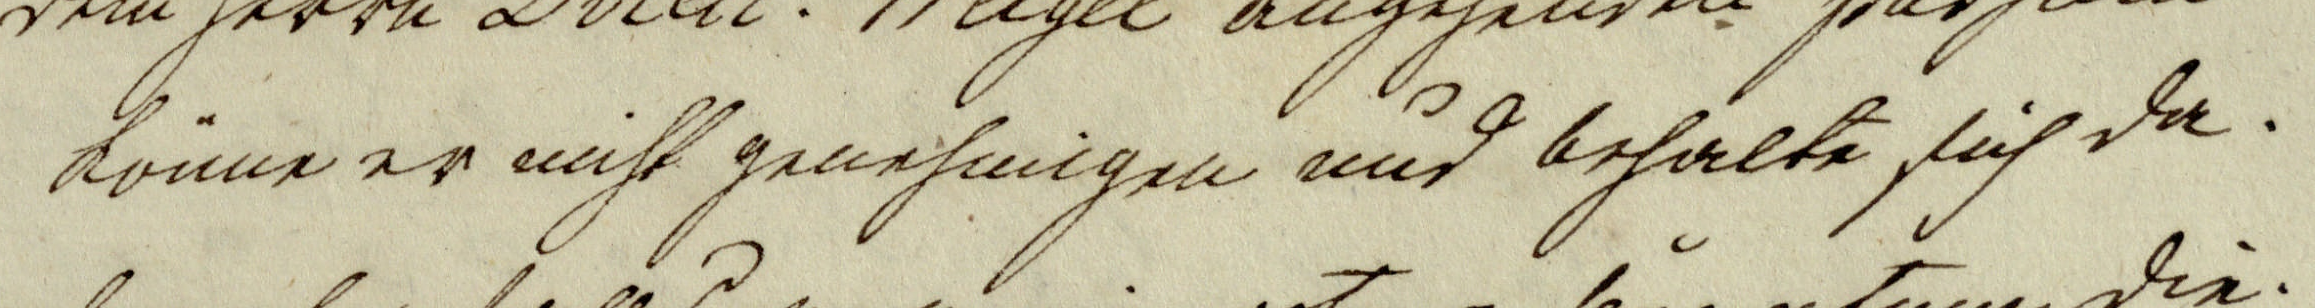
könne er nicht genehmigen und behalte sich da¬
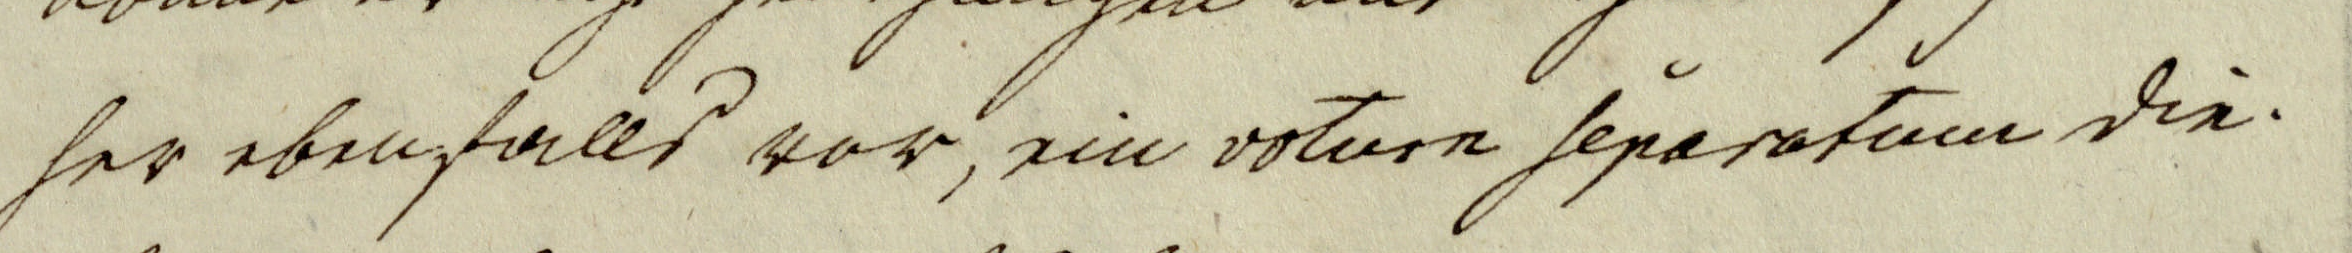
her ebenfalls vor, ein votum separatum die¬
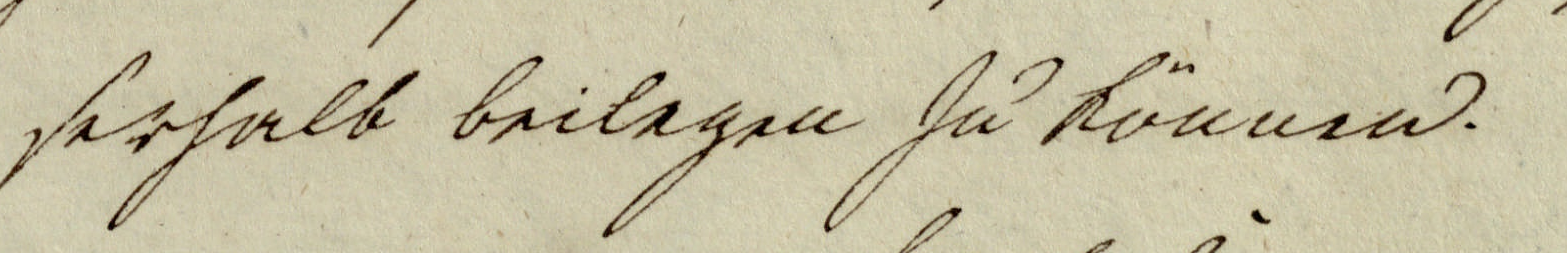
serhalb beilegen zu können.
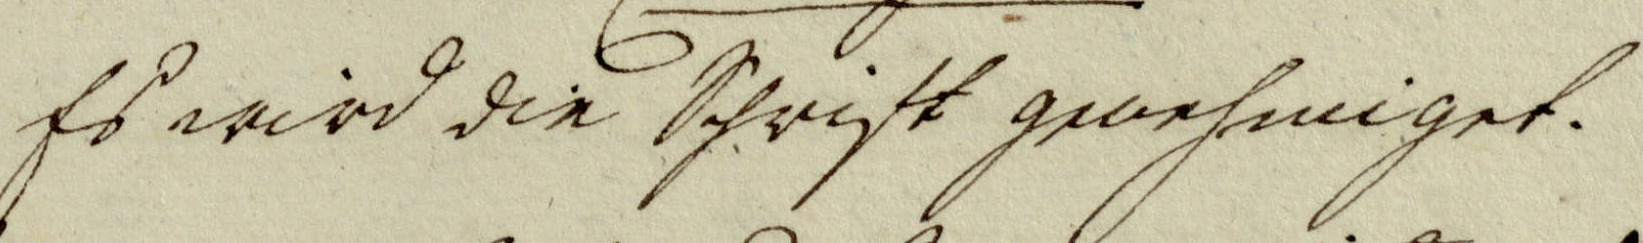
Es wird die Schrift genehmiget.
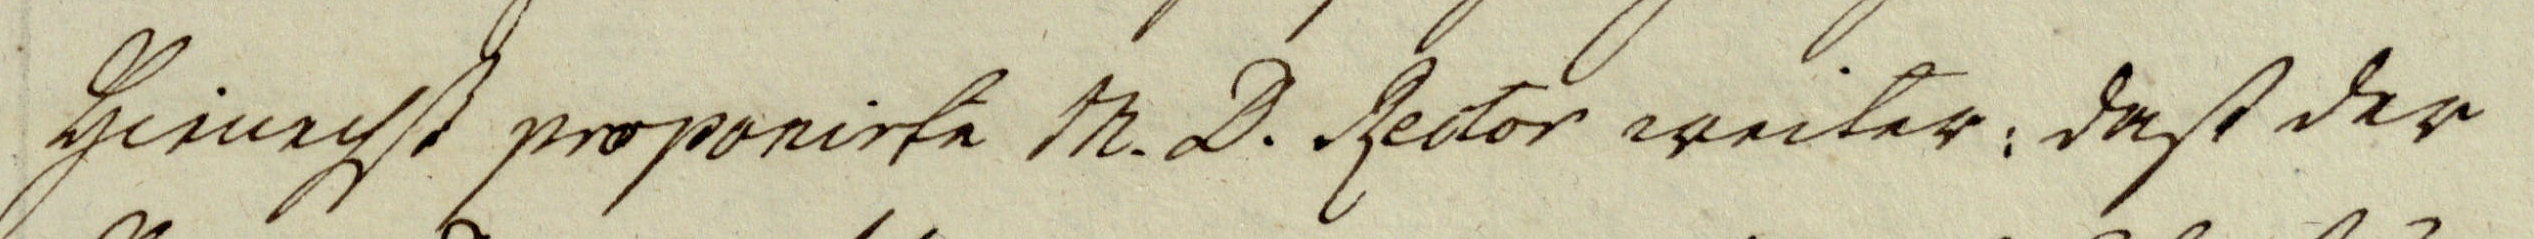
Hienechst proponirte M. D. Rector weiter, daß der
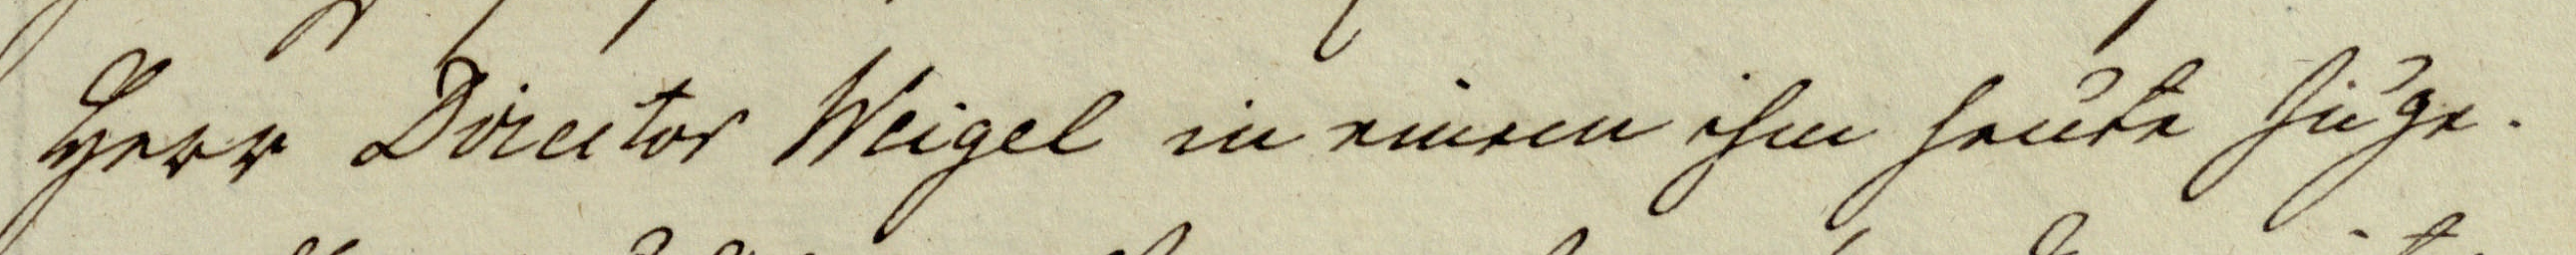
Herr Director Weigel in einem ihm heute zuge¬
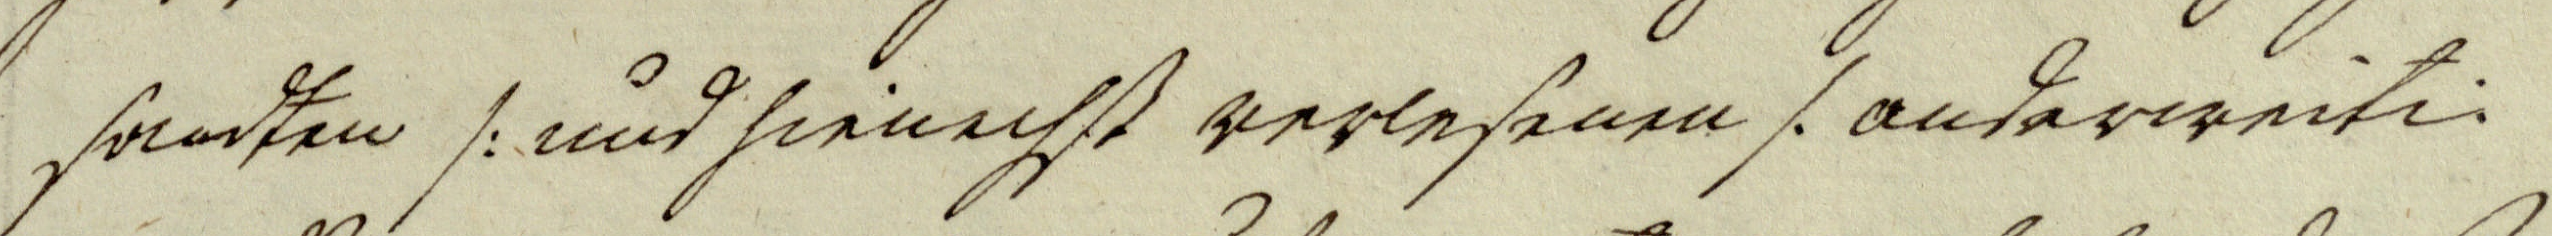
sandten /: und hienechst verlesenen/. anderweiti¬
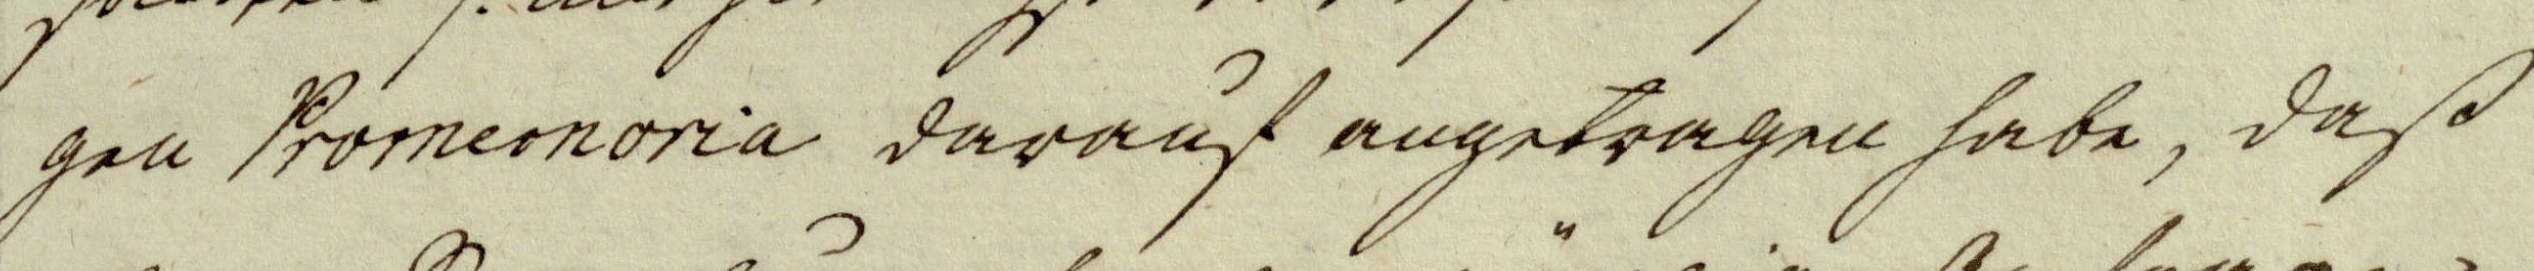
gen Promemoria darauf angetragen habe, daß
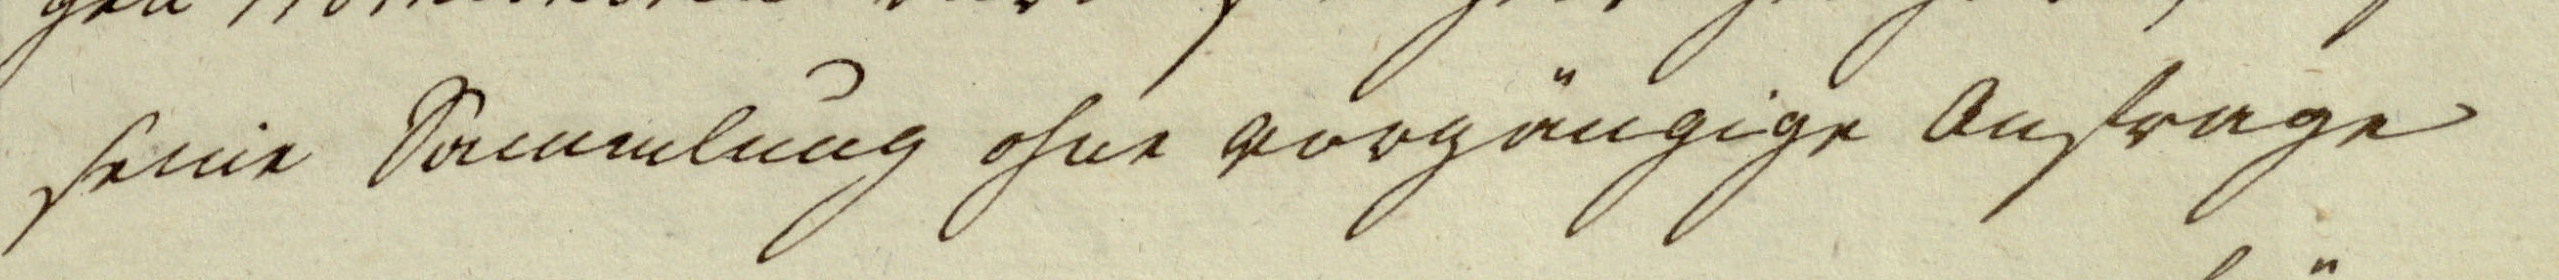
seine Sammlung ohne vorgängige Anfrage
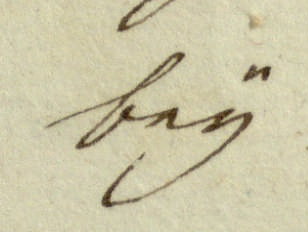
beÿ
